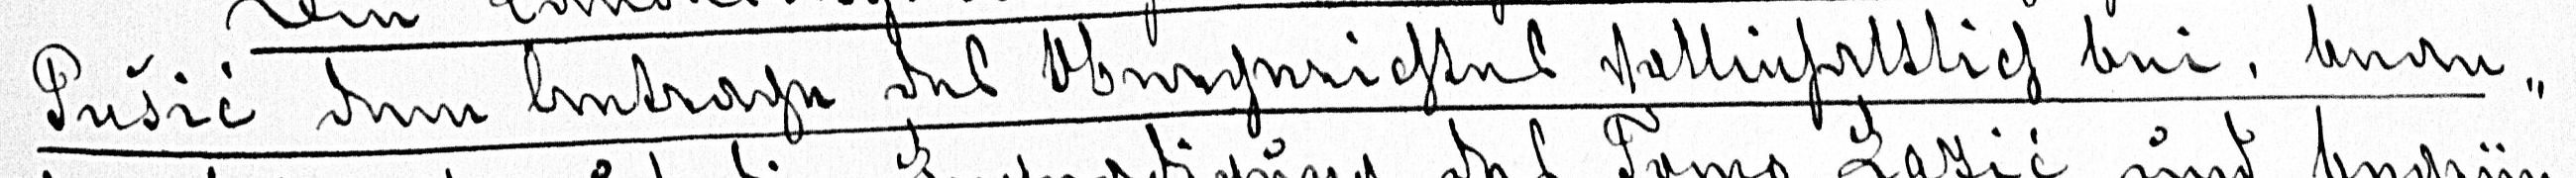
Pusić dem Antrage des Obergerichtes vollinhaltlich bei, bean¬
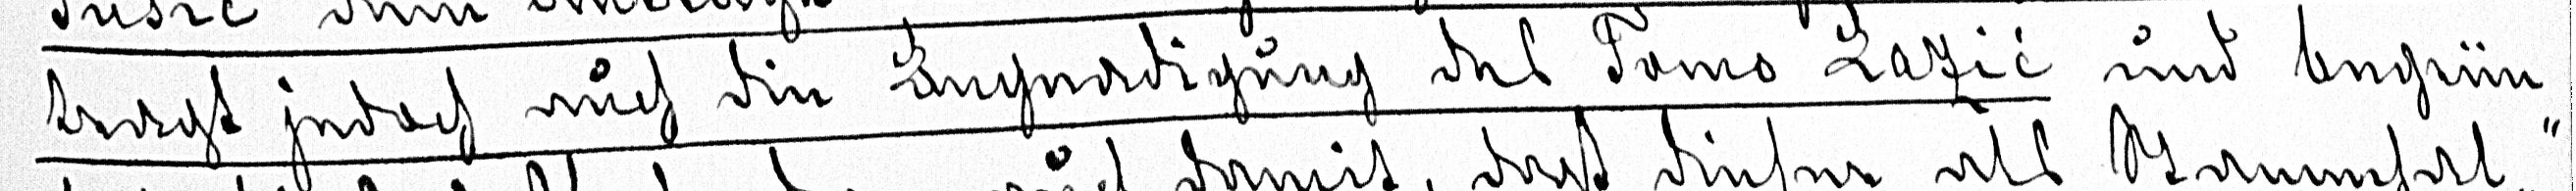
tragt jedoch auch die Begnadigung des Tomo Lazić und begrün¬
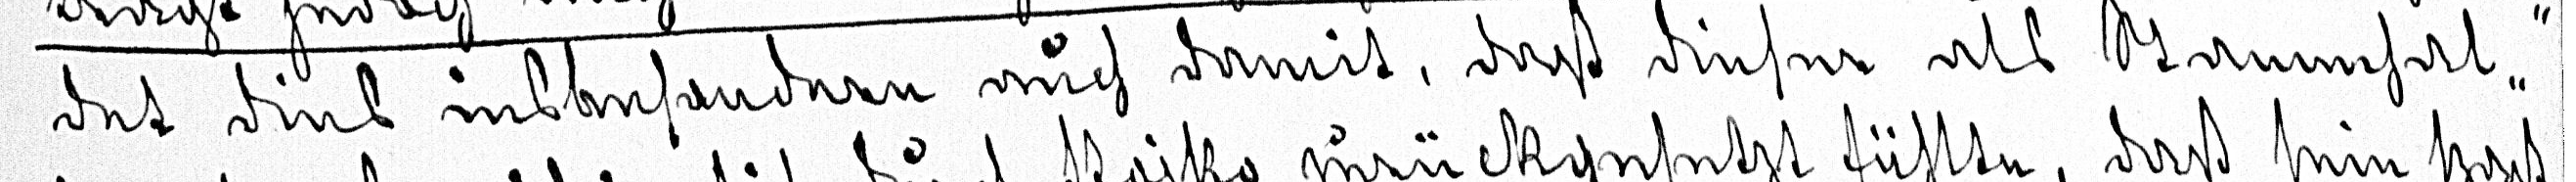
det dies insbesondere auch damit, daß dieser als Stammhal¬
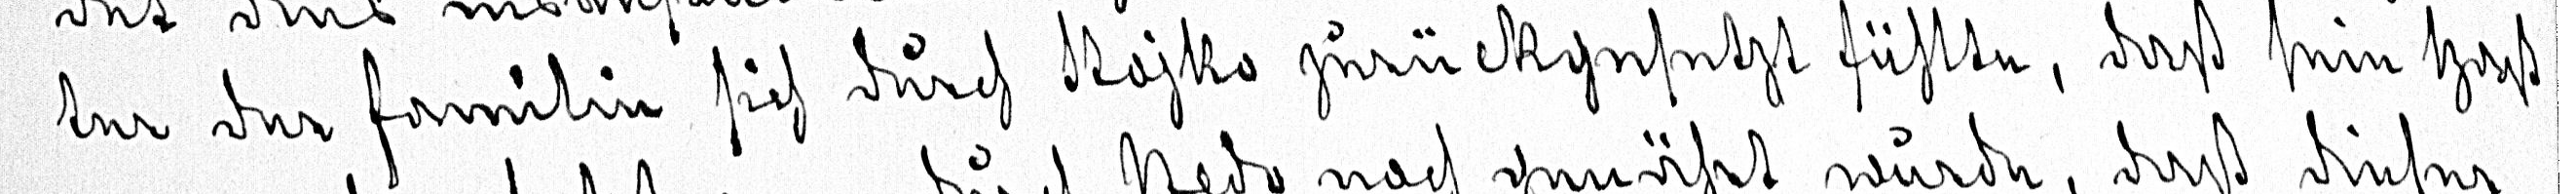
ter der Familie sich durch Kojko zurückgesetzt fühlte, daß sein Haß
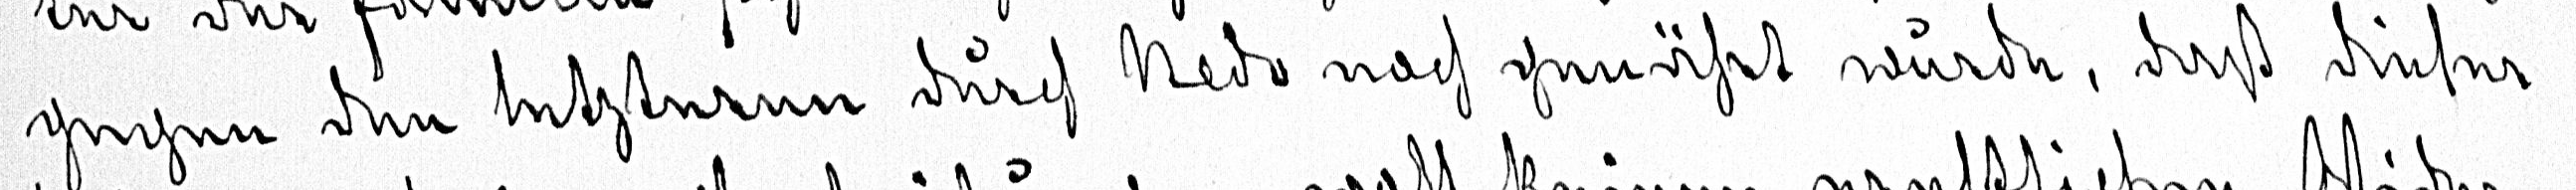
gegen den letztenenn durch Nedo noch genährt wurde, daß dieser
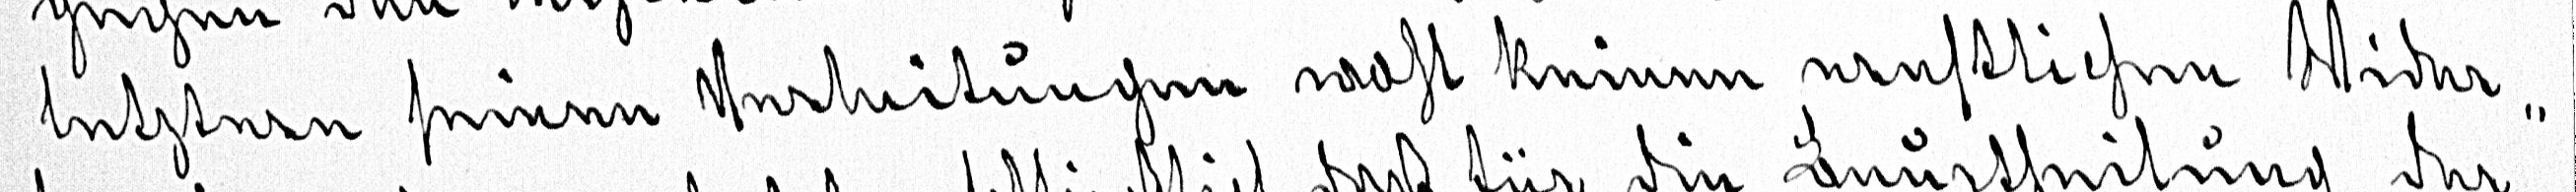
letztere seinen Verleitungen wohl keinen ernstlichen Wider¬
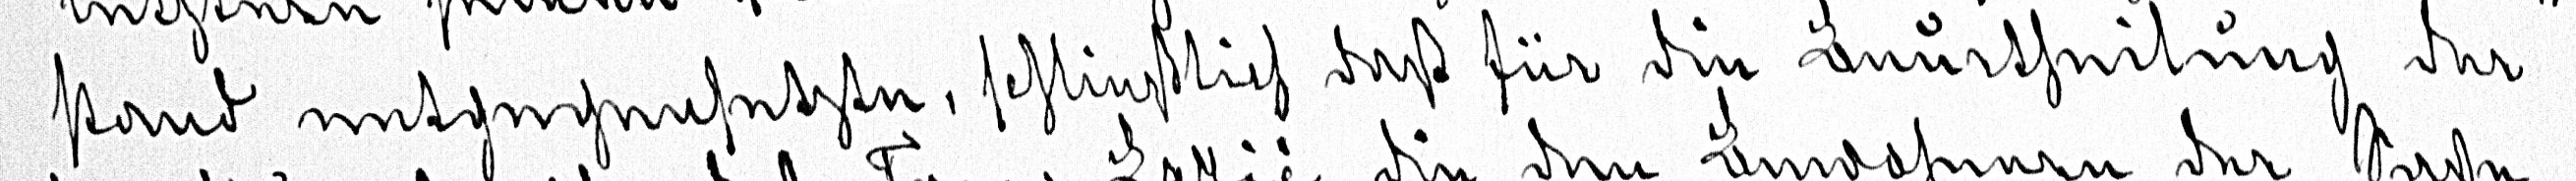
stand entgegensetzte, schließlich daß für die Beurtheilung der
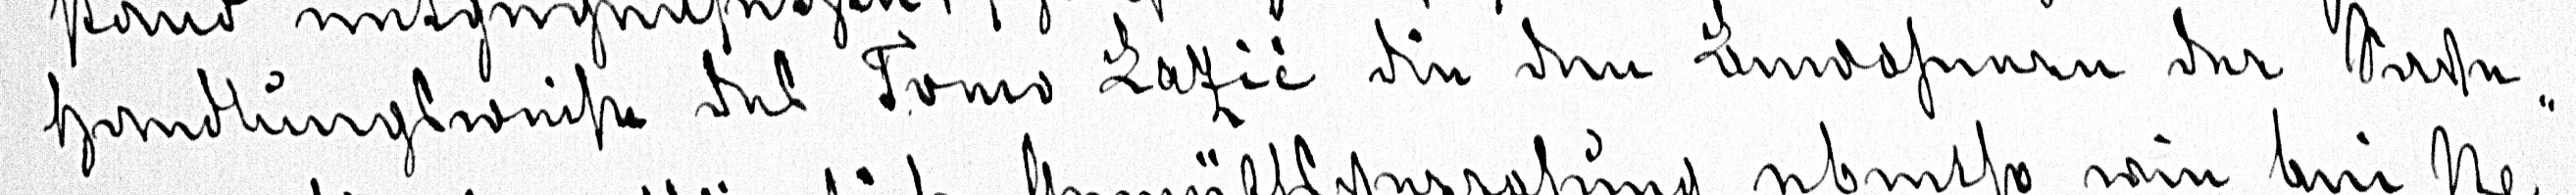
Handlungsweise des Tomo Lazić die den Bewohnern der Save¬
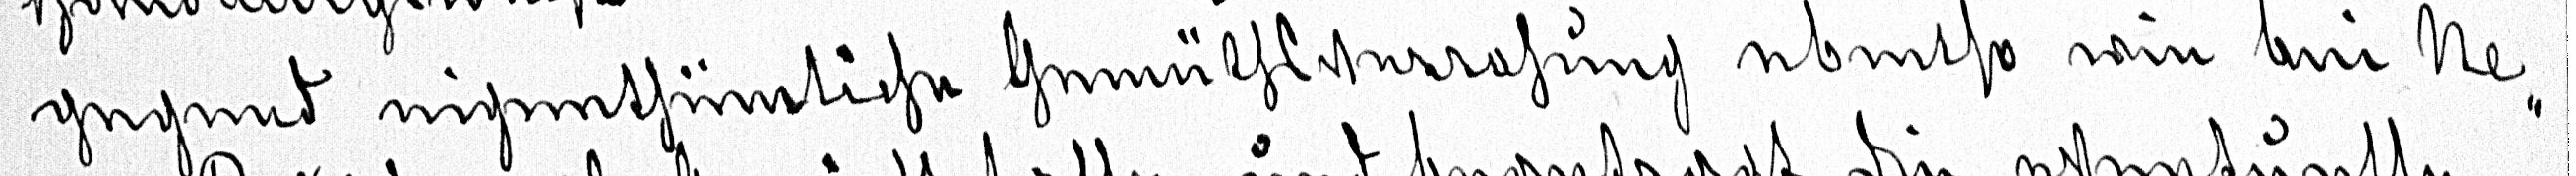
gegend eigenthümliche Gemüthsverrohung ebnest wie bei Ne¬
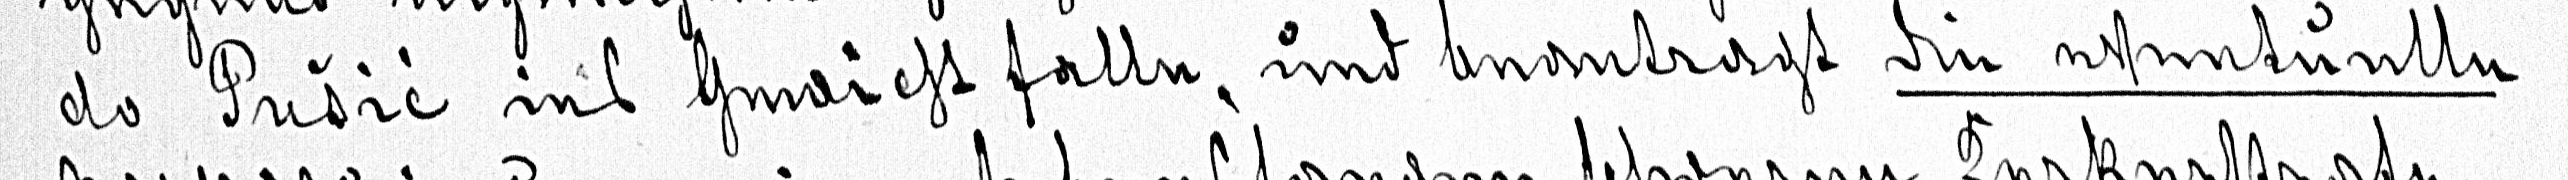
do Pusić ins Gmeicht falle und beantragt die eventuelle
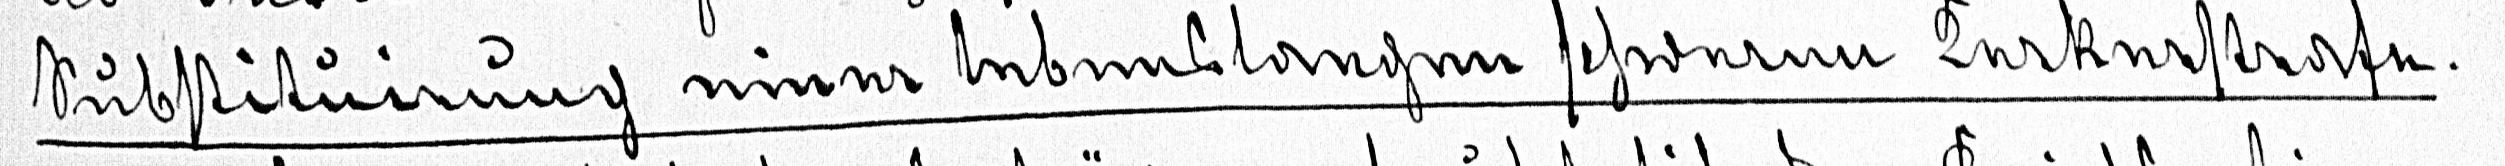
Substituirung einer lebenslangen schweren Kerkerstrafe.
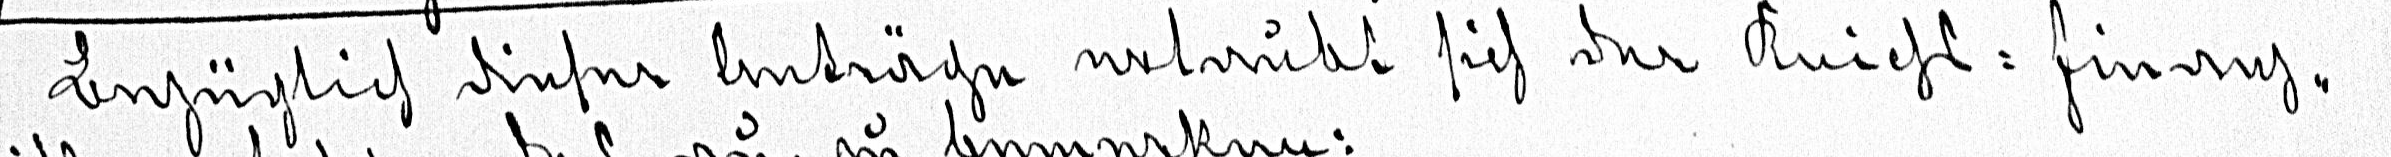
Bezüglich dieser Anträge erlaubt sich den Reichs = Finanz¬
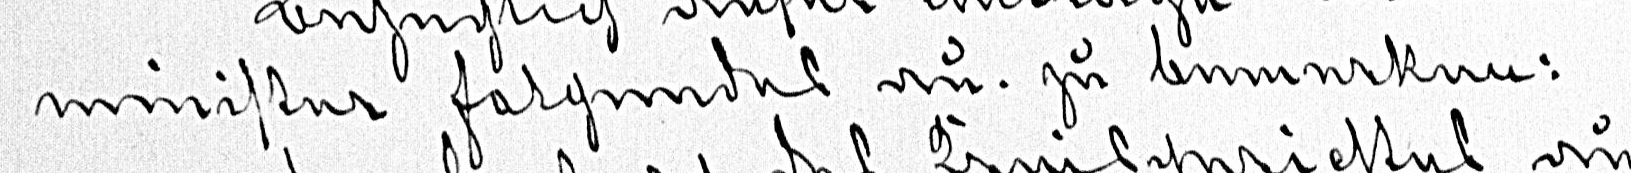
minister Folgendes au. zu bemerken:
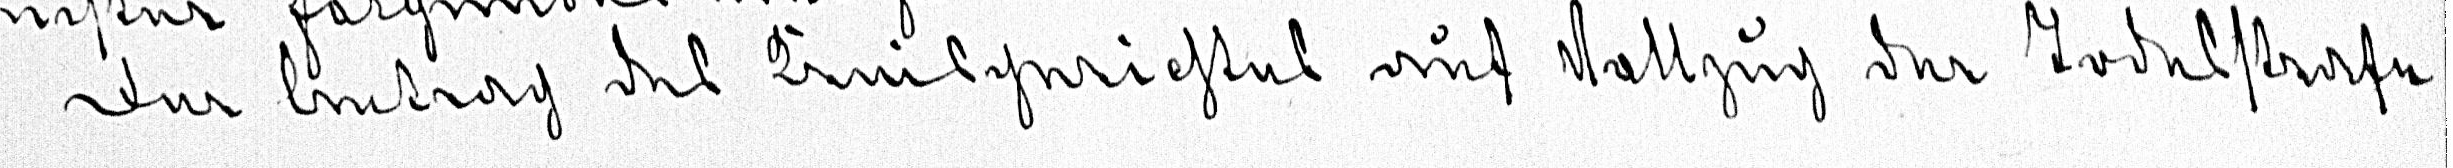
Der Antrag des Kreisgerichtes auf Vollzug der Todesstrafe
